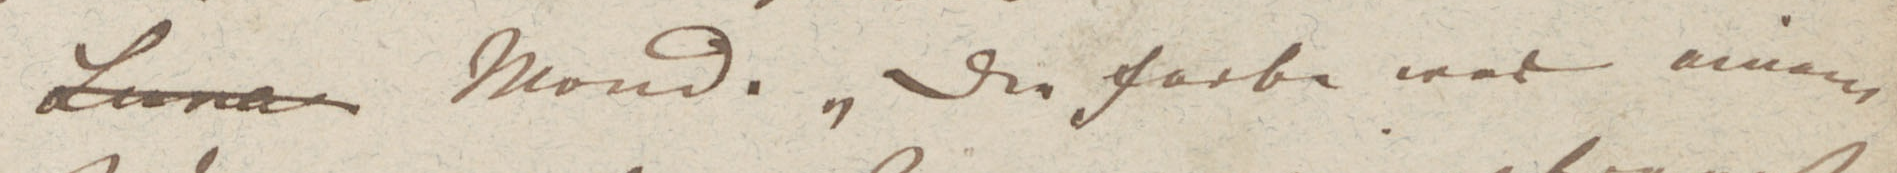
Luna Mond. "Die Farbe war einem
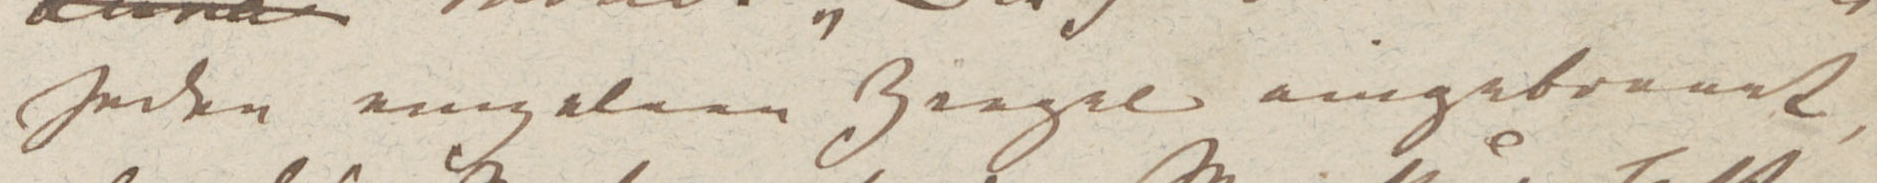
jeden einzelnen Ziegel eingebrannt,
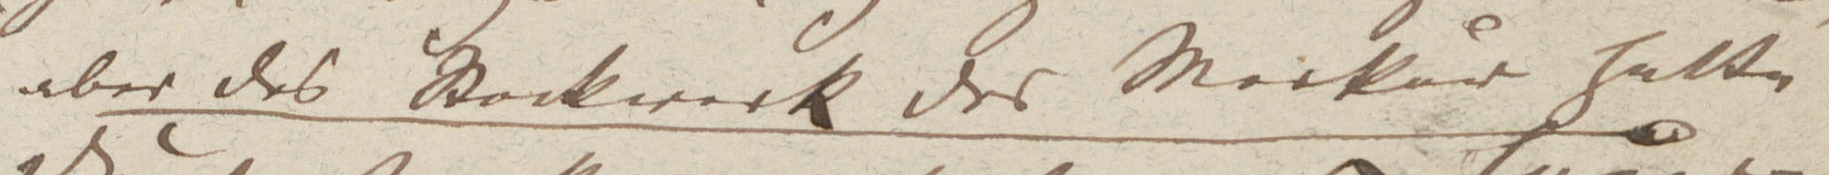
aber das Stockwerk des Merkur hatte
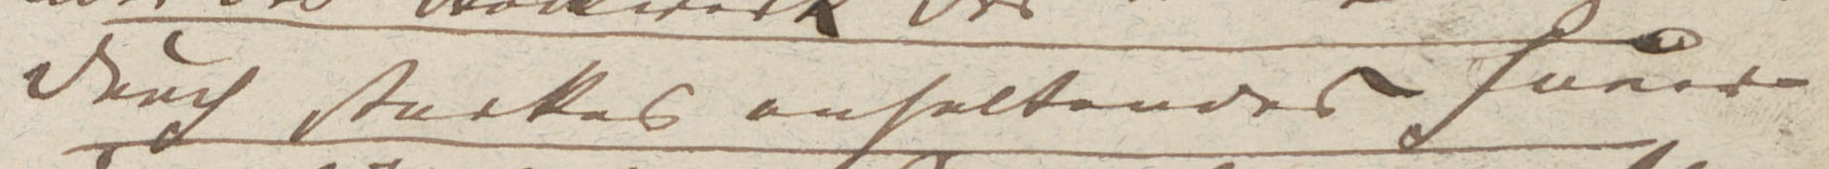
durch starkes anhaltendes Feuer
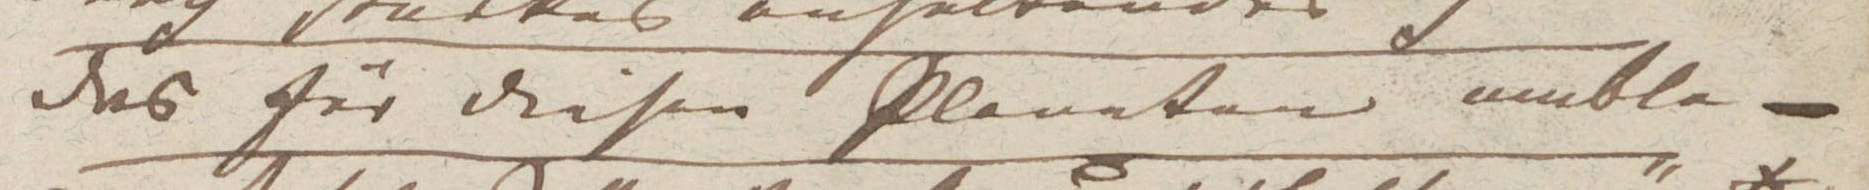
das für diesen Planeten emble-
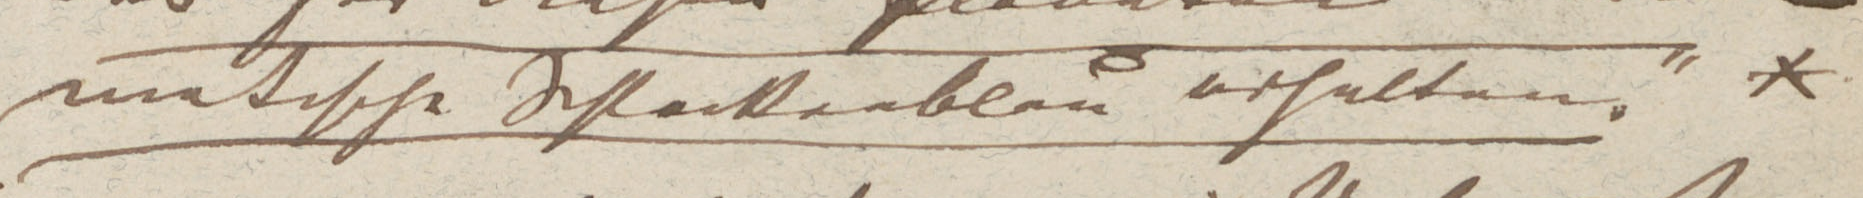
matische Schlackenblau erhalten." %
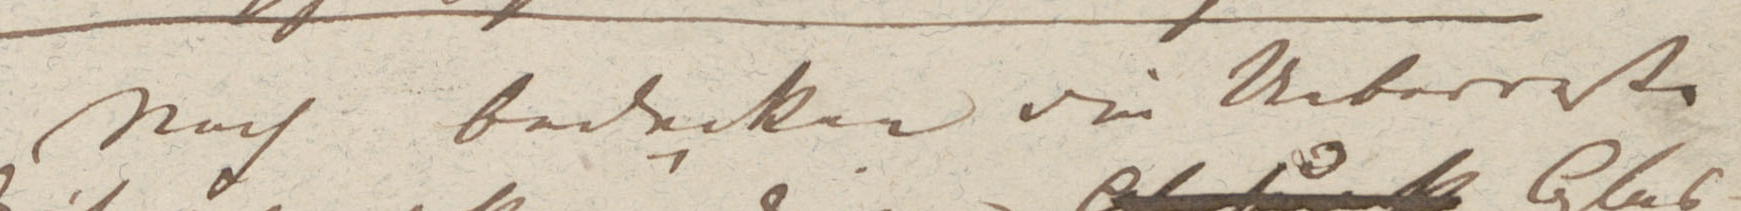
Noch bedecken die Ueberreste
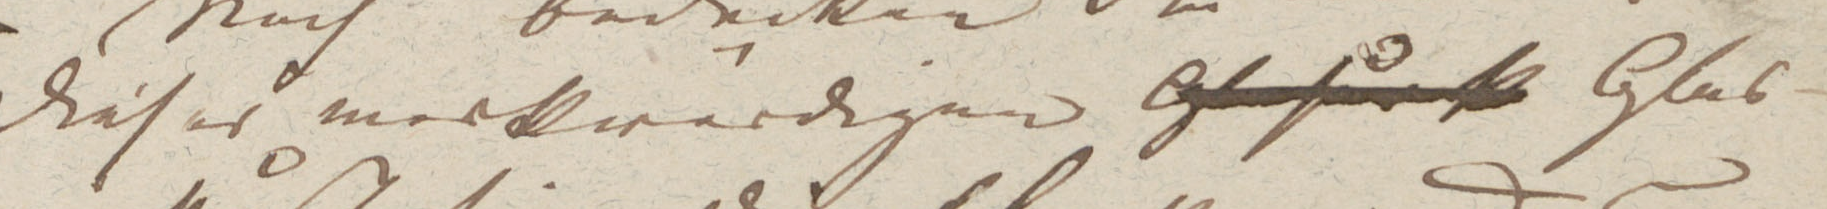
dieser merkwürdigen Glasur Glas-
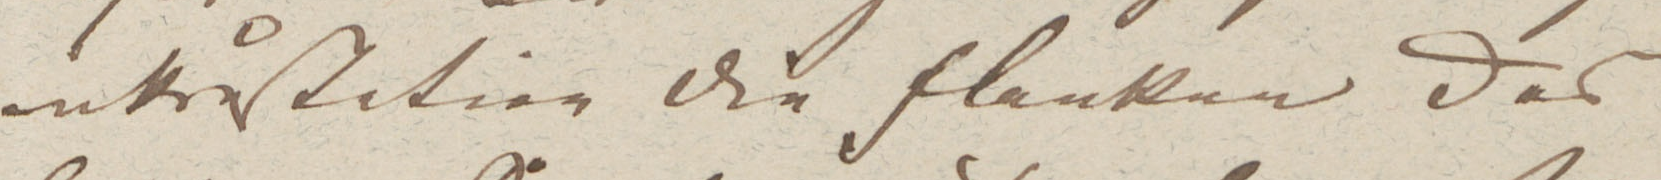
inkrustation die Flanken des
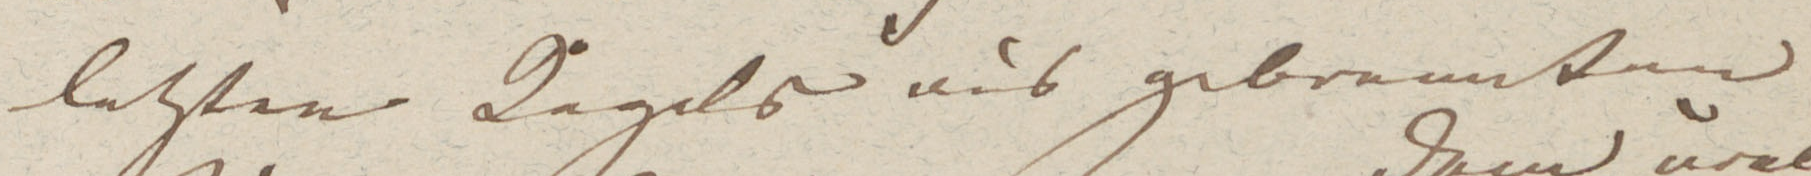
letzten Kegels aus gebrannten
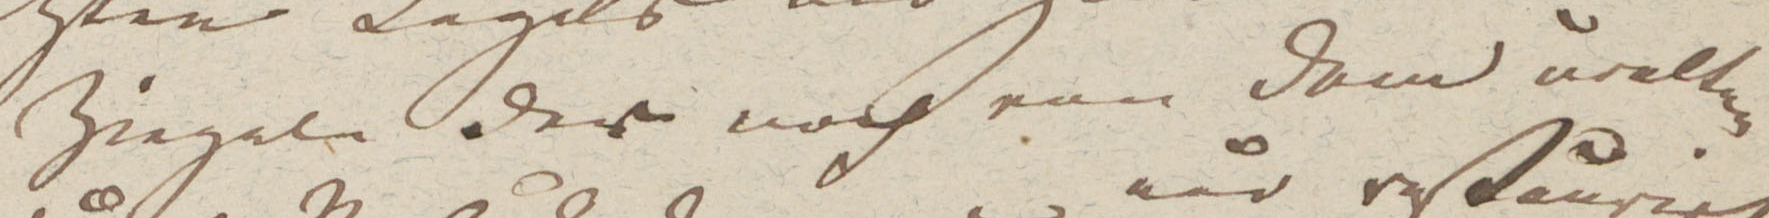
Ziegeln der noch von dem uralten
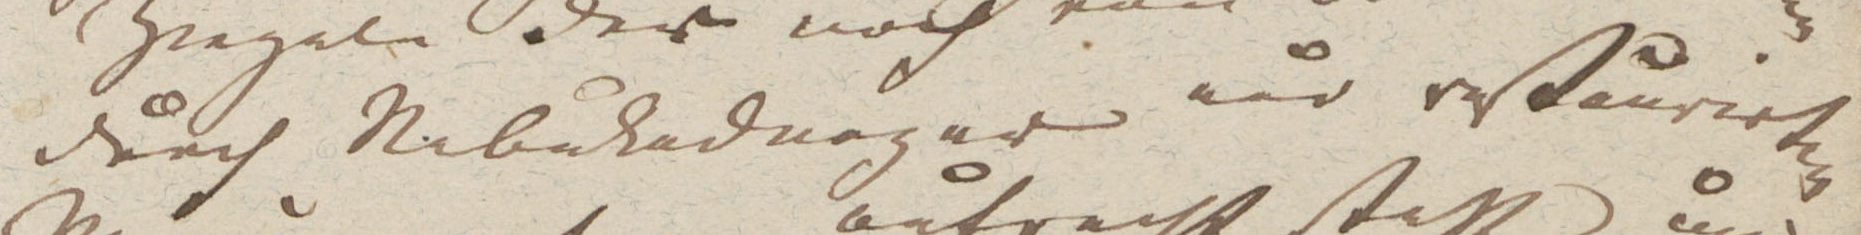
durch Nebukadnezar nur restaurirten
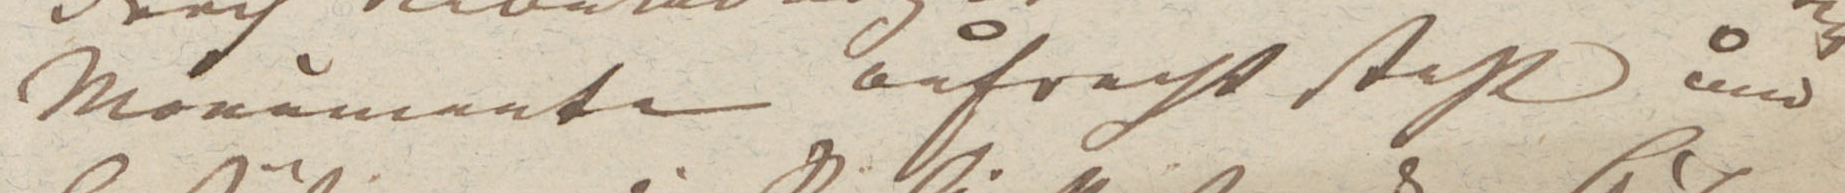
Monumente aufrecht steht und
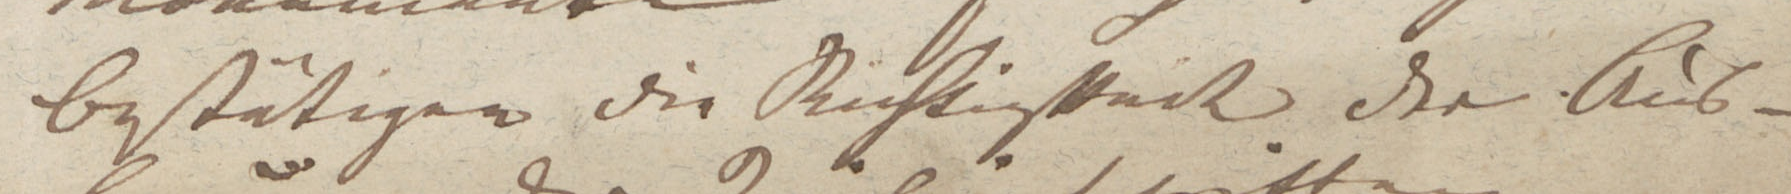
bestätigen die Richtigkeit der Aus-
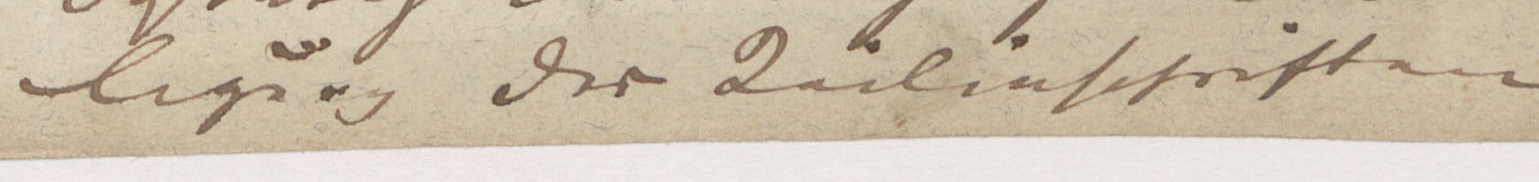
legung der Keilinschriften
